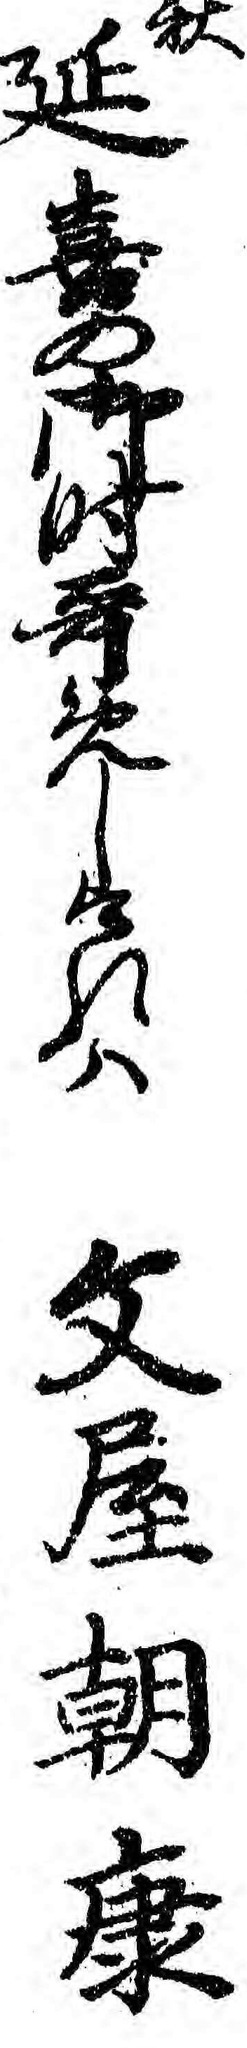後撰集秋延喜の御時哥めしけれは文屋朝康
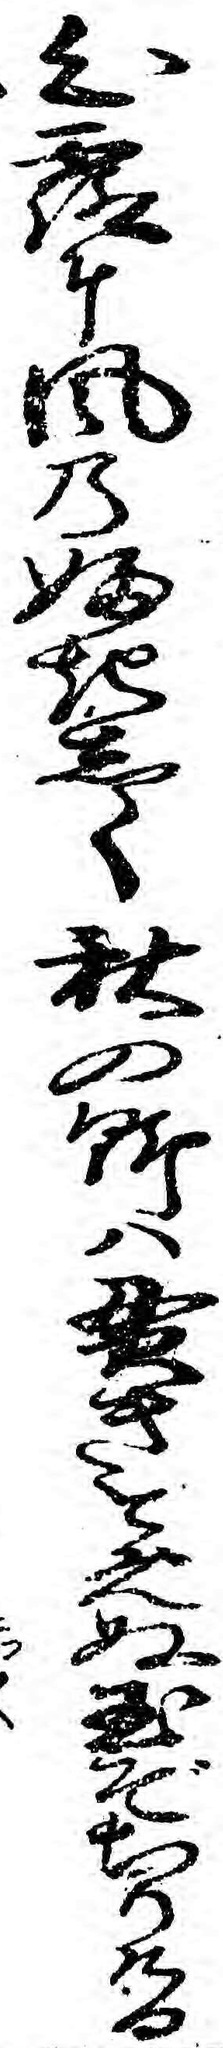白露に風のふきしく秋の野は貫きとめぬ玉ぞちりける
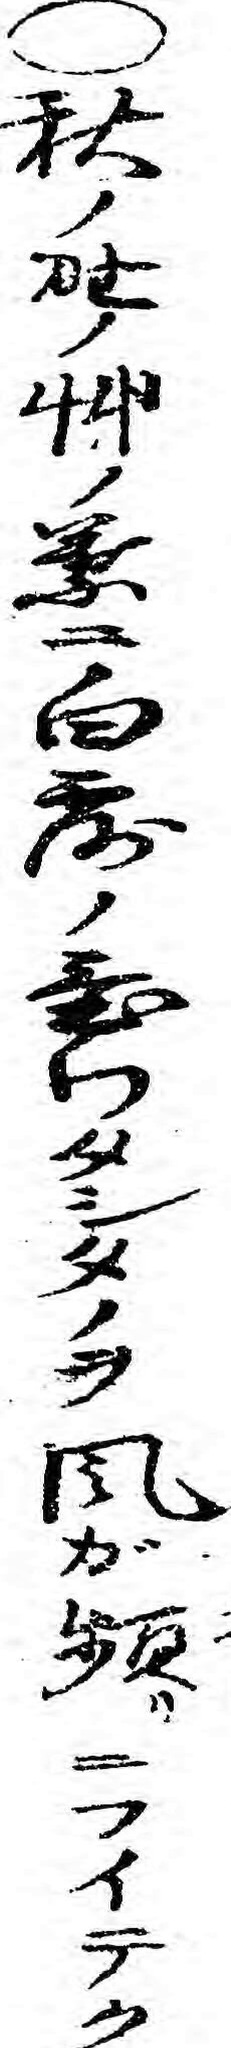○秋ノ野ノ草ノ葉に白露ノ置ワタシタノヲ風ガ頻ニフイテク
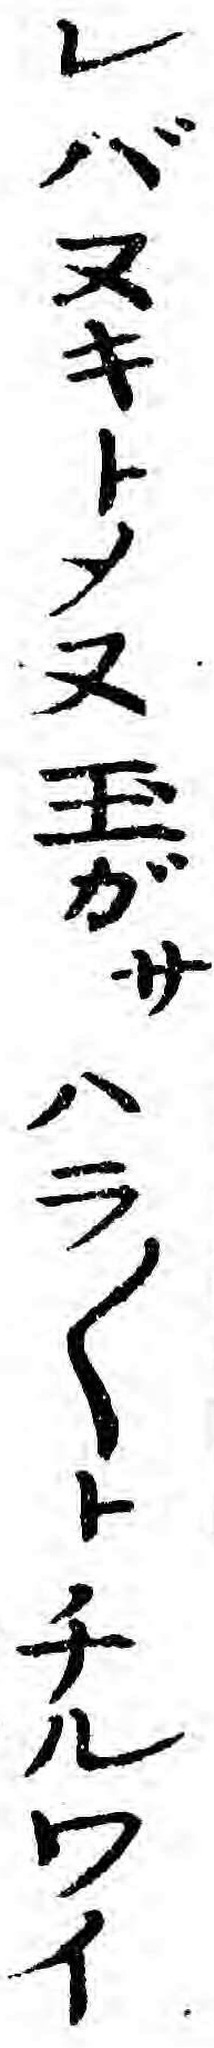レバヌキトメヌ玉ガサハラ〳〵トチルワイ
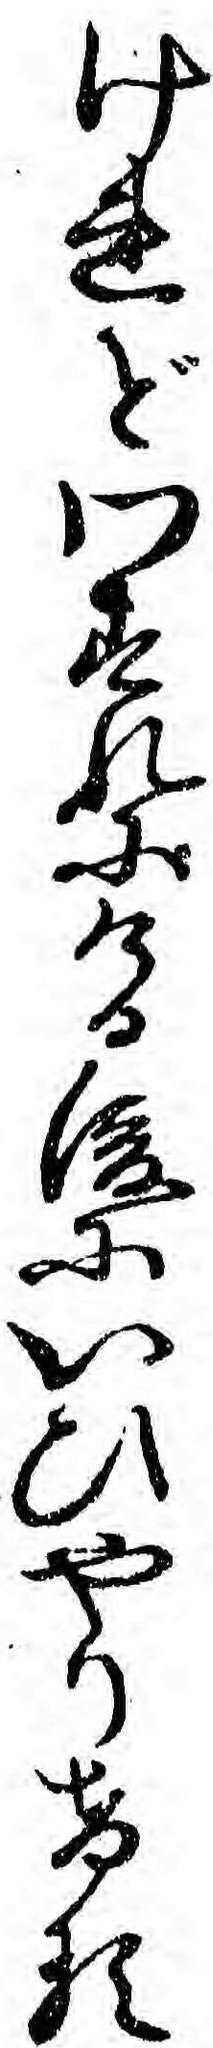けれどわすれにける後にいひやりける
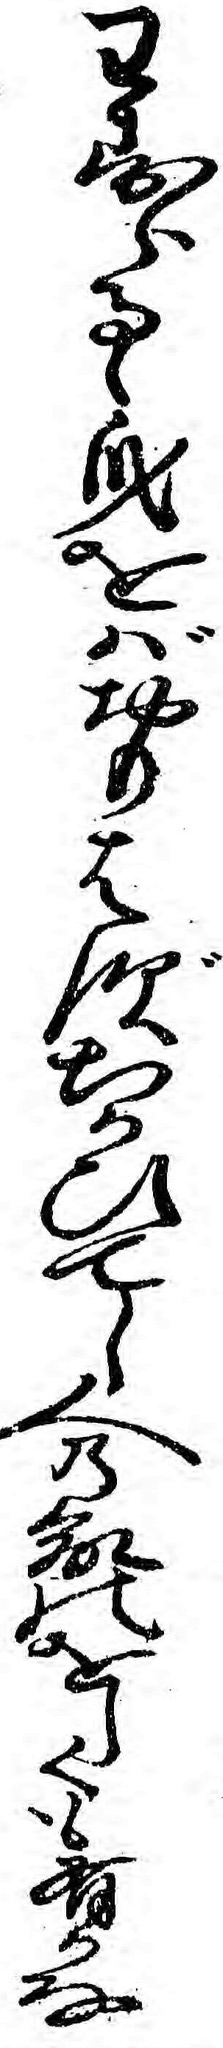わすらるゝ身をばおもはずちかひてし人の命のをしくも有かな
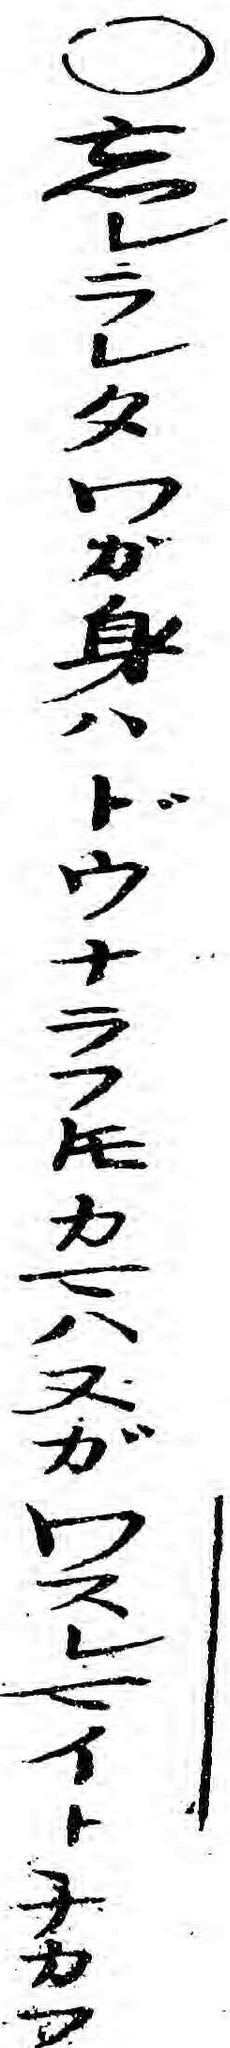○忘レラレタワガ身ハドウナラフトモカマハヌガワスレマイトチカフ
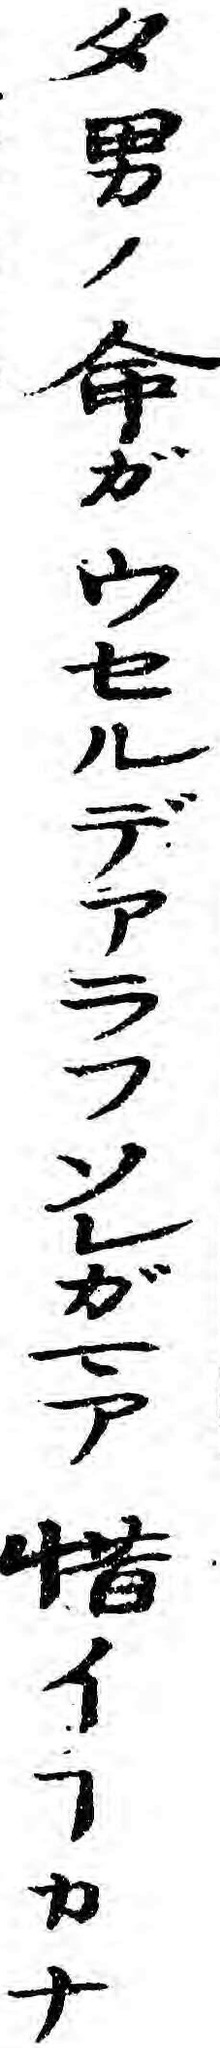タ男ノ命ガウセルデアラフソレガマア惜イコトカナ
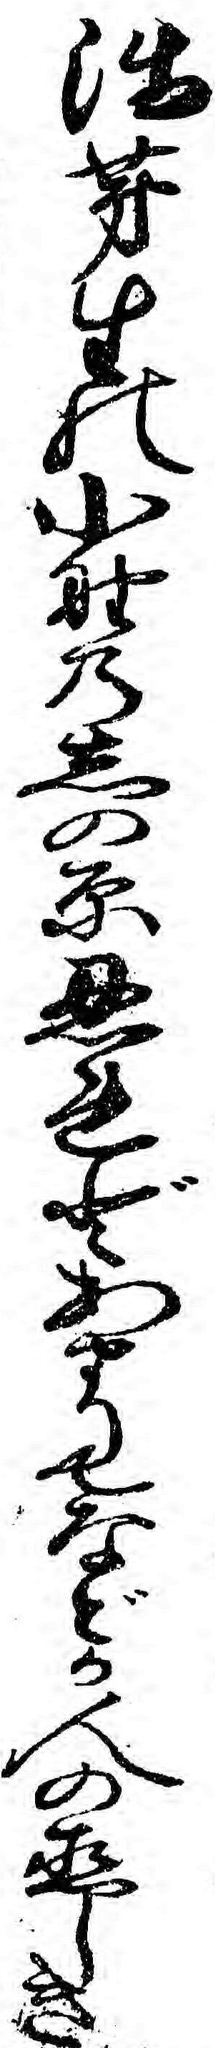浅茅生の小野のしの原忍れどあまりてなどか人の恋しき
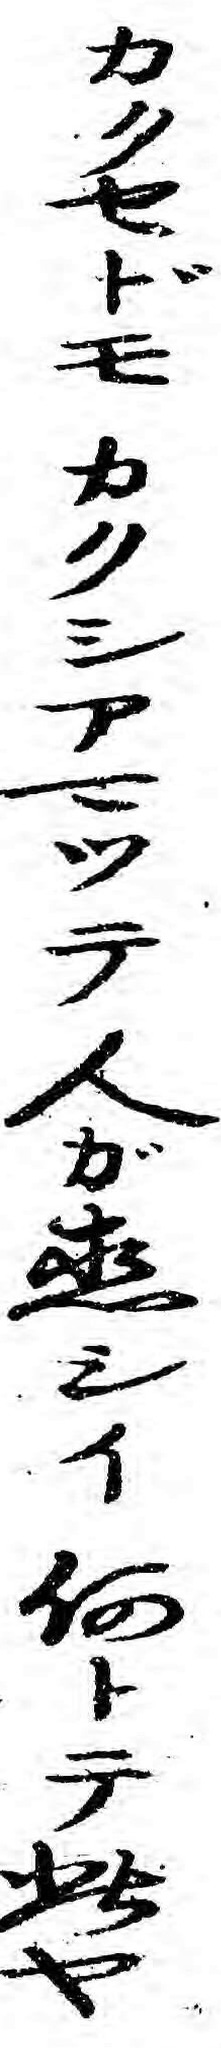○一二カクセドモカクシアマツテ人ガ恋シイ何トテ此ヤ

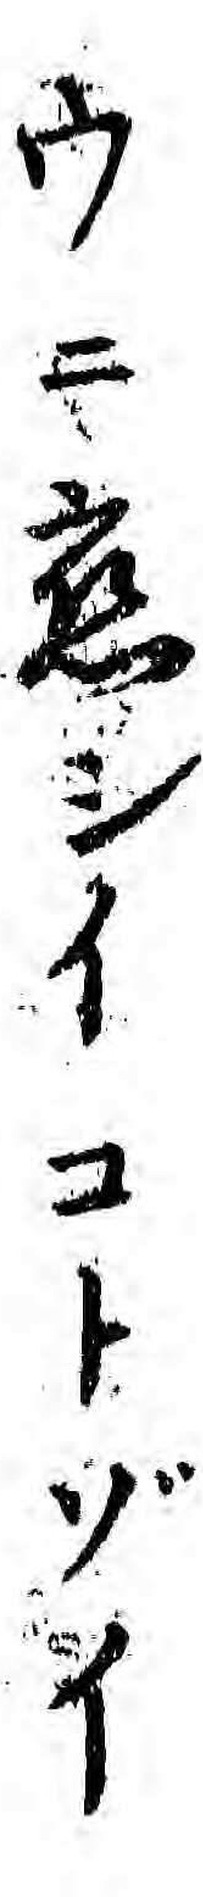ウニ恋シイコトゾイ
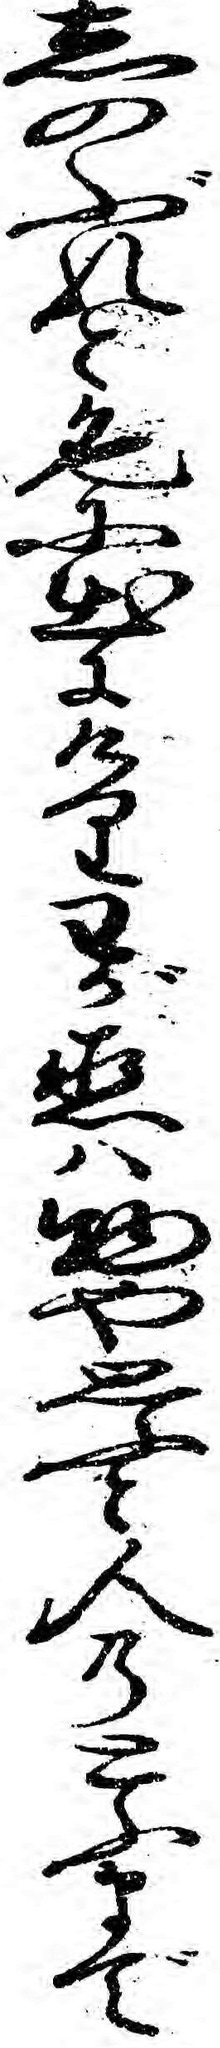しのぶれど色に出にけりわが恋は物や思ふと人のとふまで
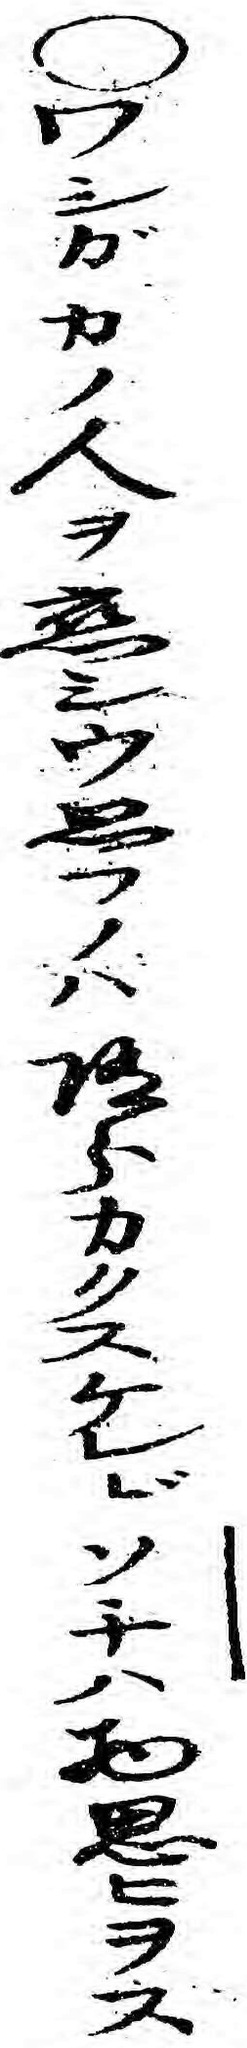○ワシガカノ人ヲ恋シウ思フノハ随分カクスケレドソチハ物思ヒヲス
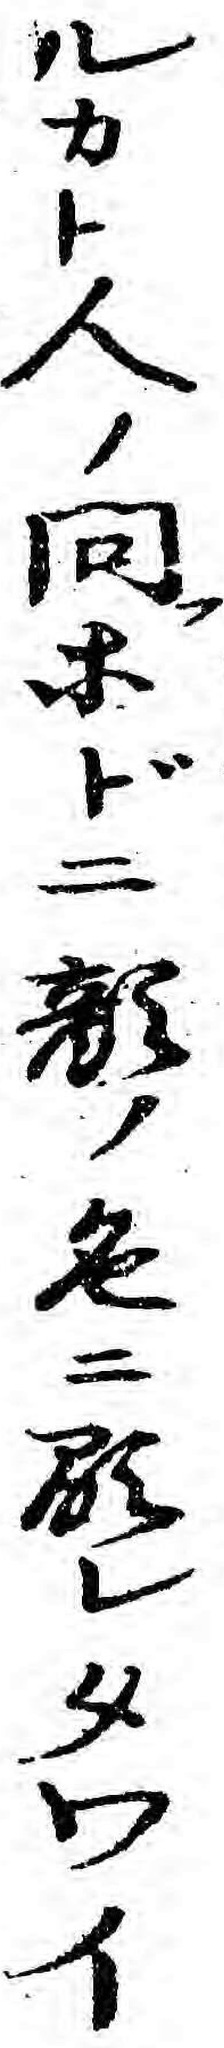ルカト人ノ問ホドニ顔ノ色ニ顕レタワイ
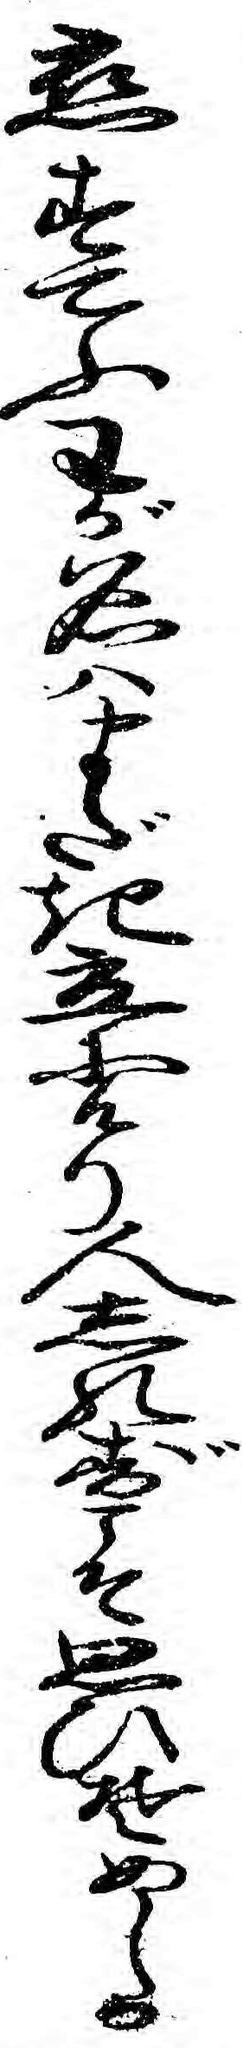恋すてふわが名はまだき立にけり人しれずこそ思ひそめしか
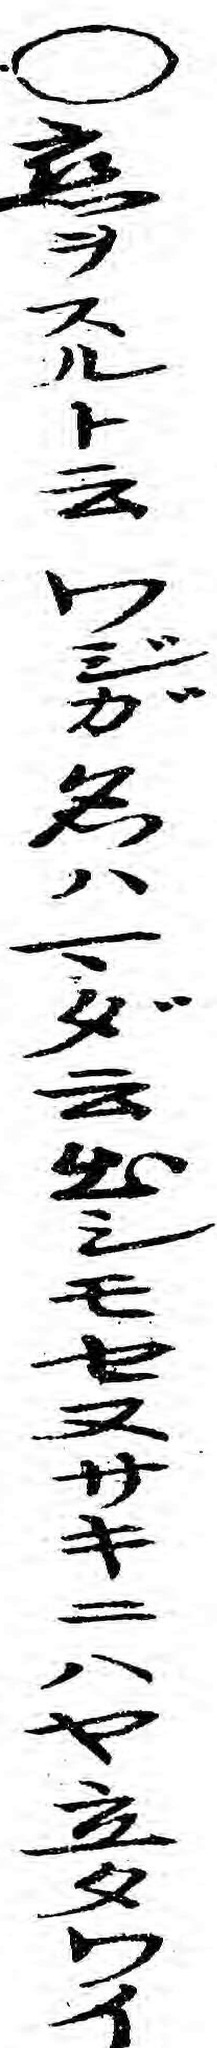○恋ヲスルト云ワジガ名ハマダ云出シモセヌサキニハヤ立タワイ
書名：百人一首／小倉の山ふみ
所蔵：国文学研究資料館
